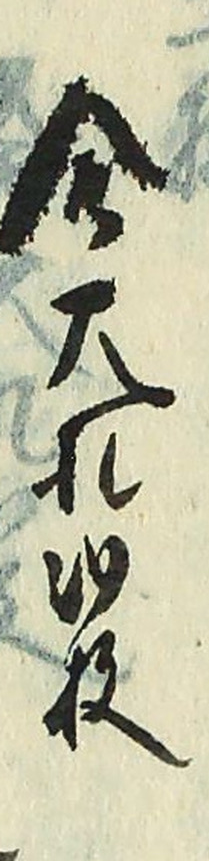合大札弐枚
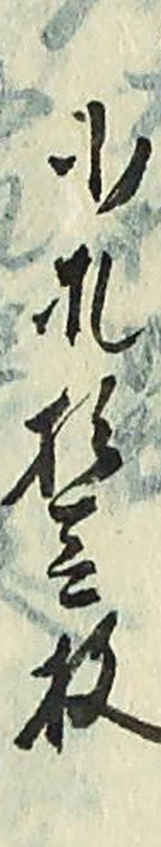小札拾壱枚
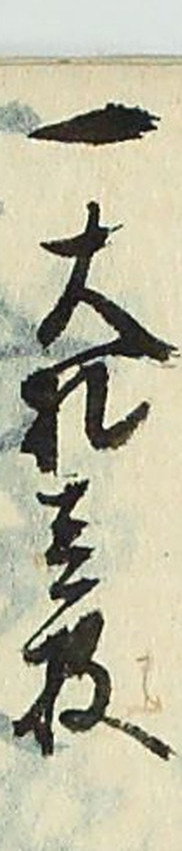合大札弐枚
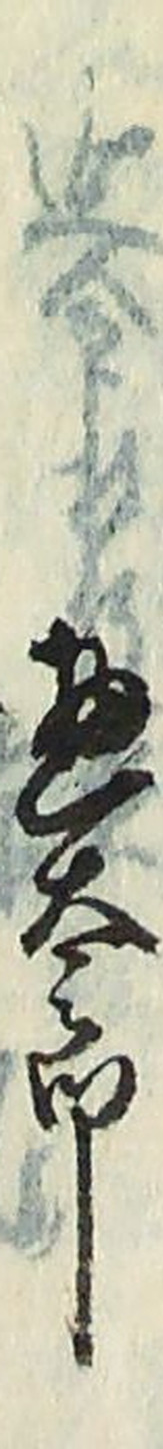惣太郎
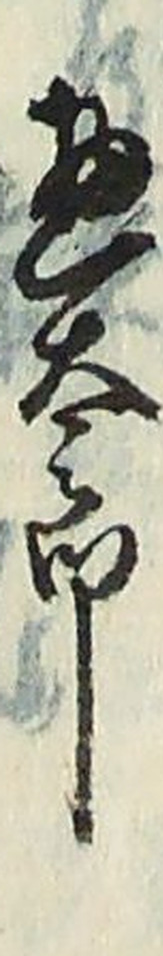惣太郎
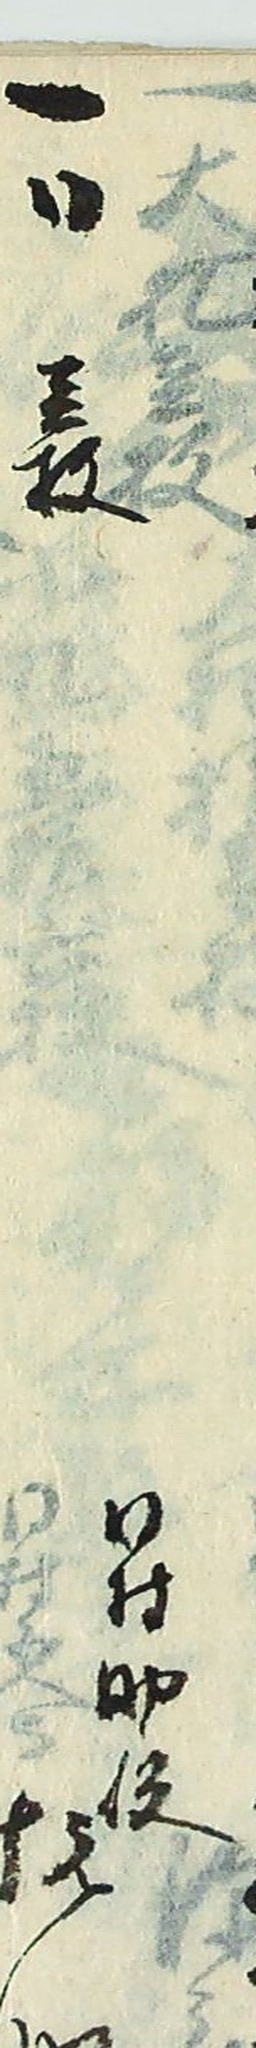一同壱枚同村助役
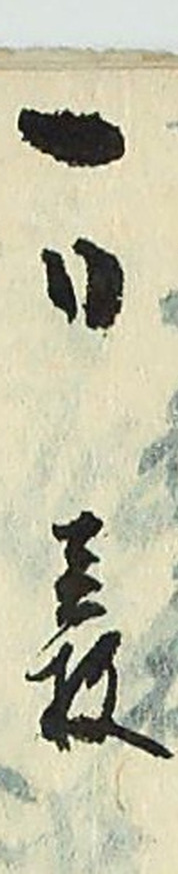一同壱枚同
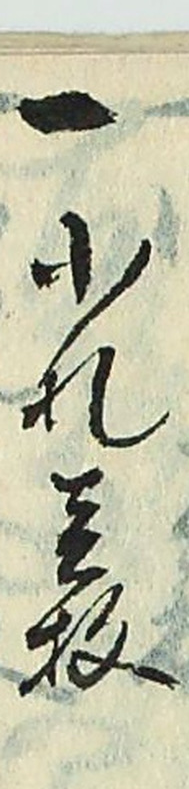一同壱枚同
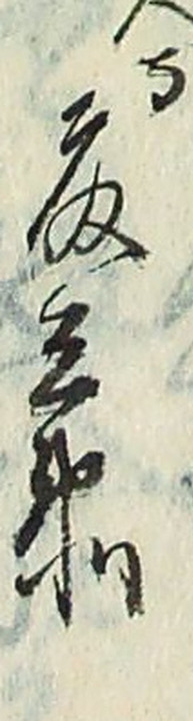藤兵衛
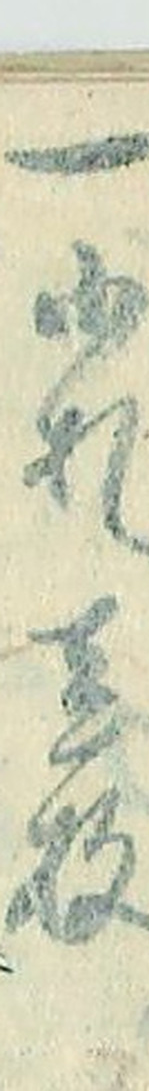一同壱枚同
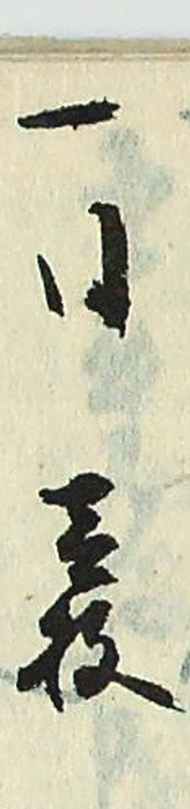一同壱枚同
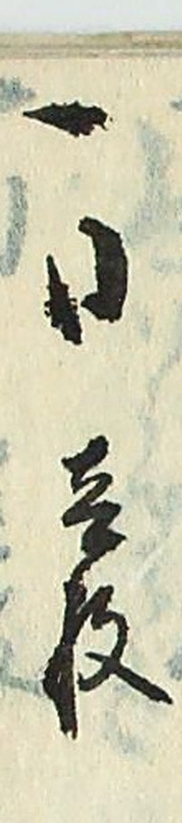一同壱枚同
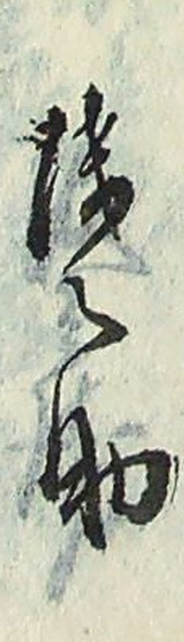徳之助
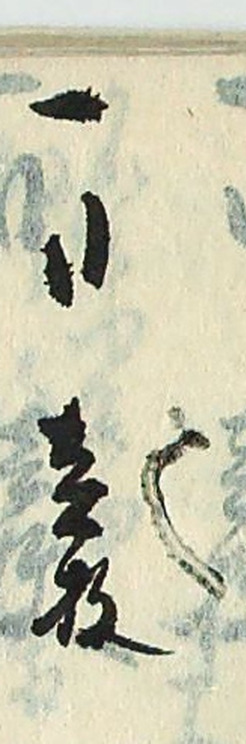一同壱枚同
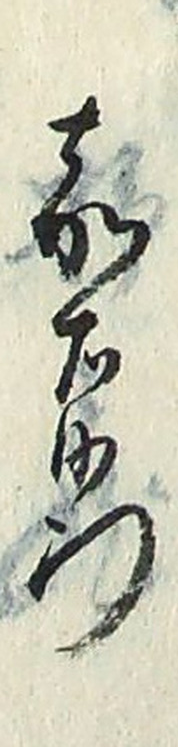嘉右衛門
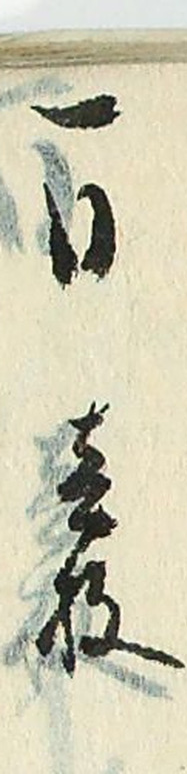一同壱枚同
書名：諸御用御□受書控
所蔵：鳴門教育大学 Naruto University of Education
